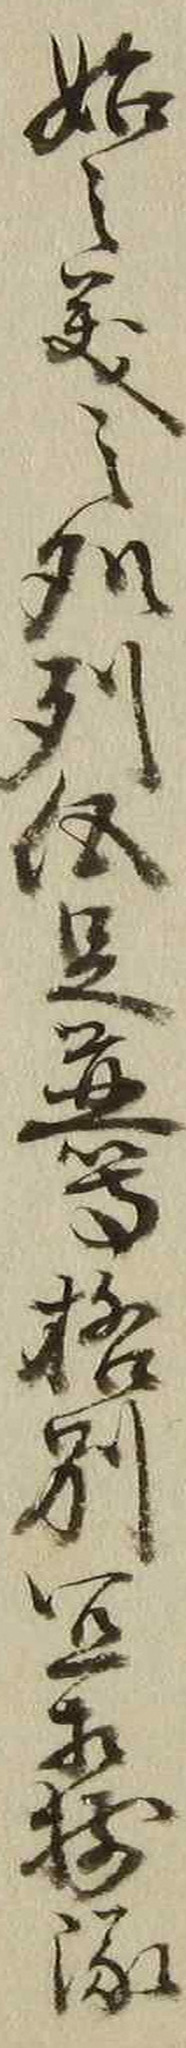始之義之処列伍足並等格別宜相揃隊
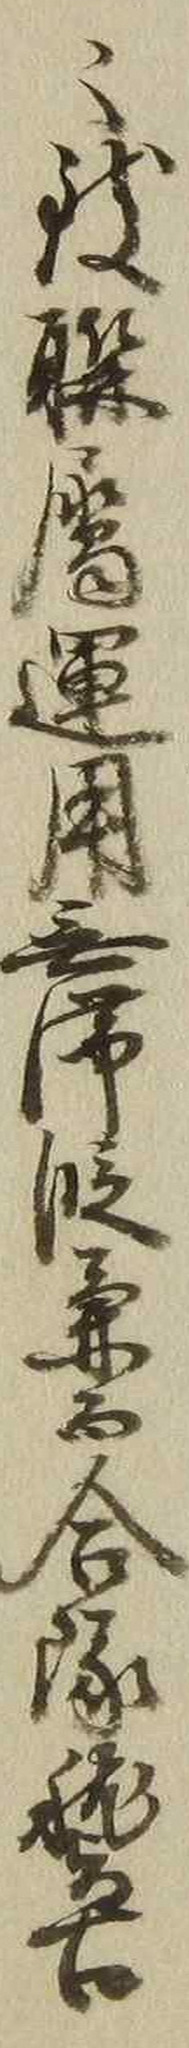々致聯層運用無滞段兼而合隊稽古
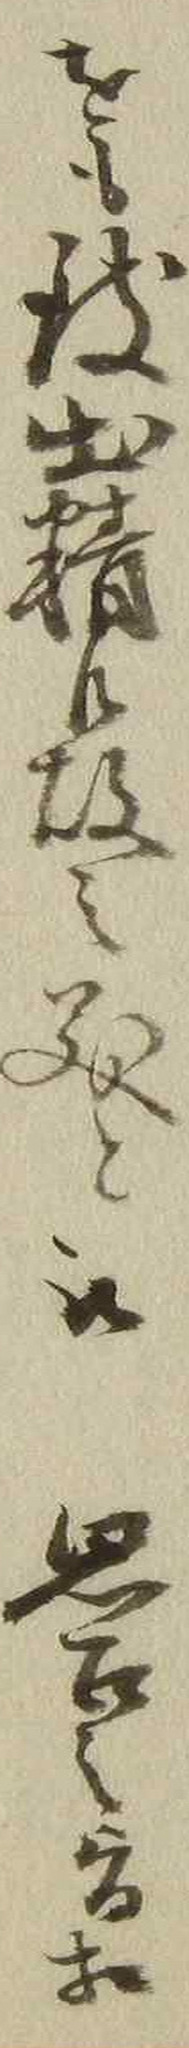をも致出精候故之義と被思召之旨相
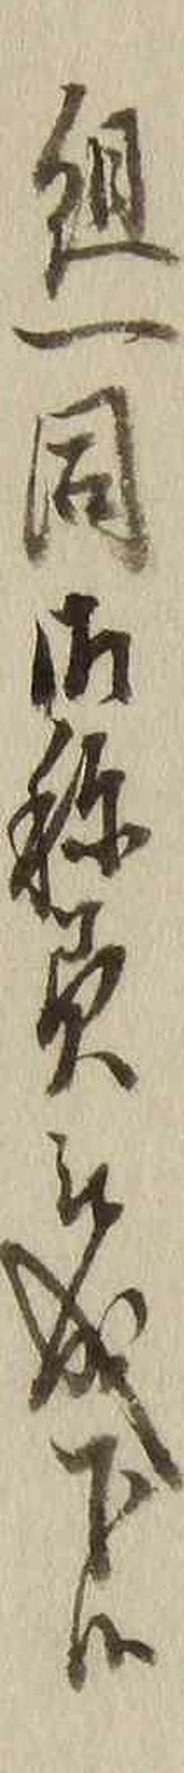組一同御称美被成下候
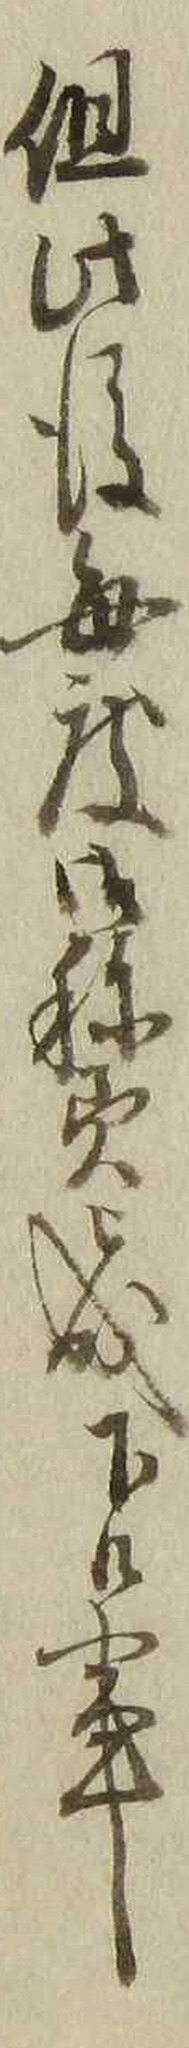但此後毎度御称美被成下候事
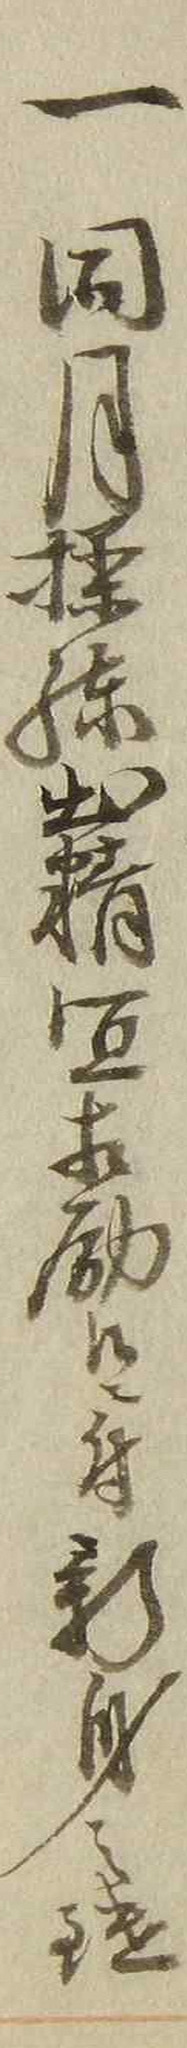一同月操練出精宜相勤候ニ付新身之鑓
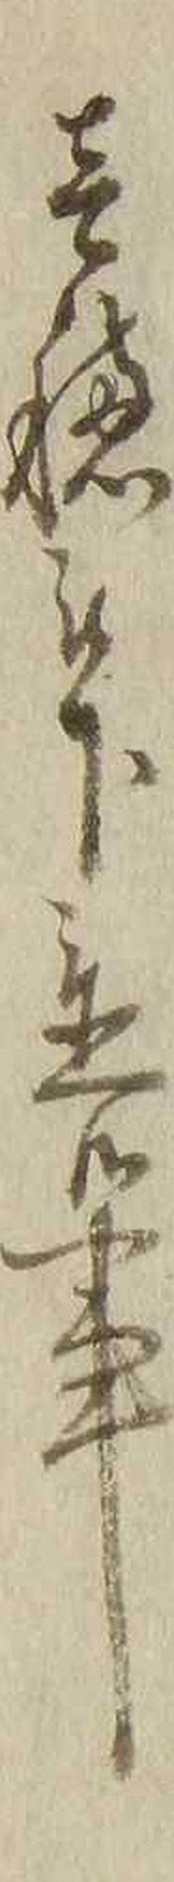壱穂被下置候事

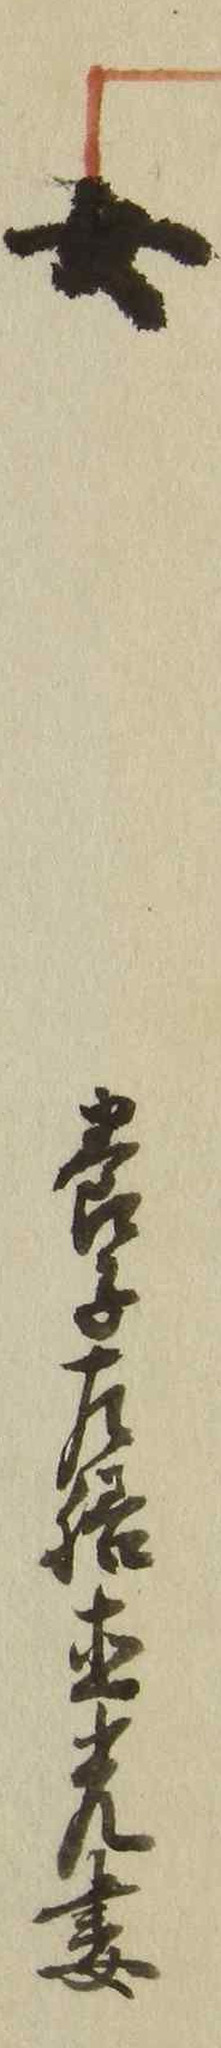女養子左膳直光妻
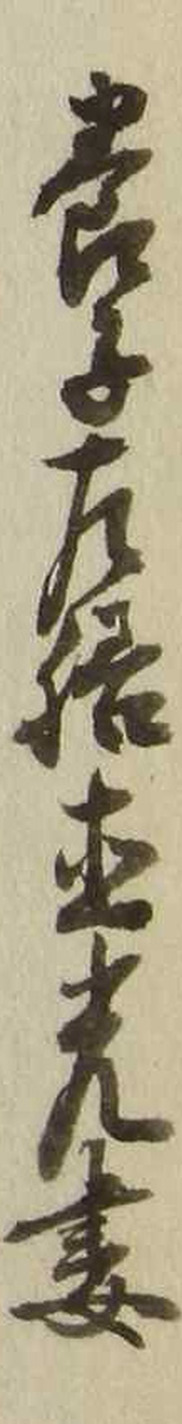女養子左膳直光妻
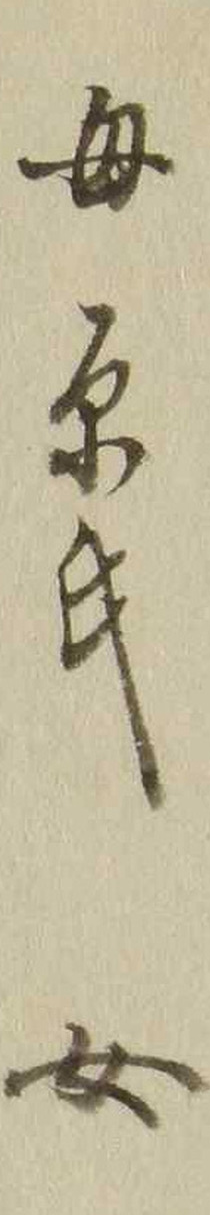母原氏女
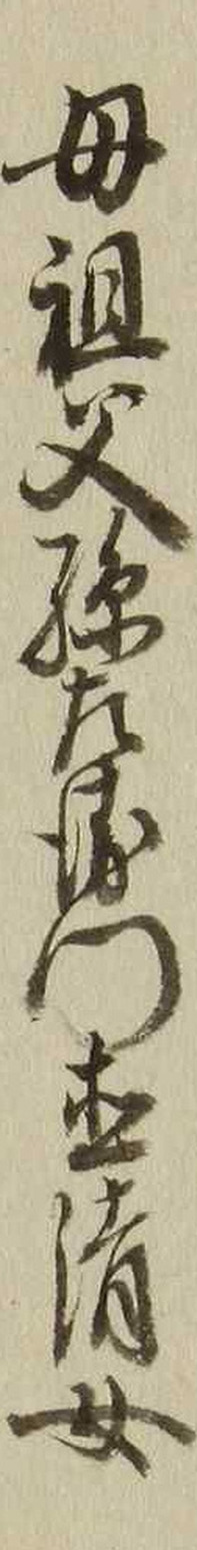母祖父孫左衛門直清女
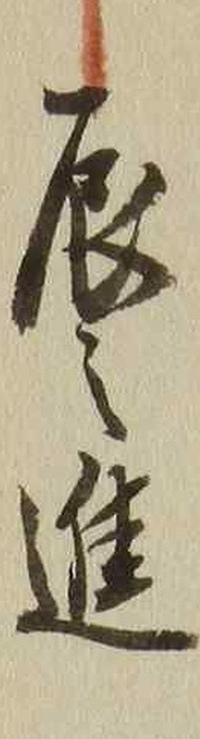辰之進
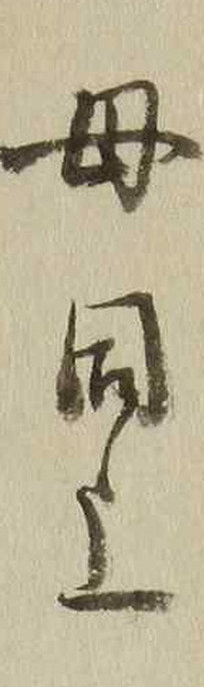母同上
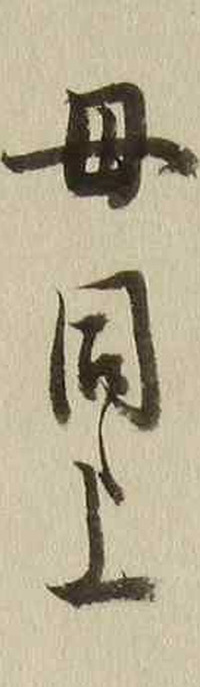母同上
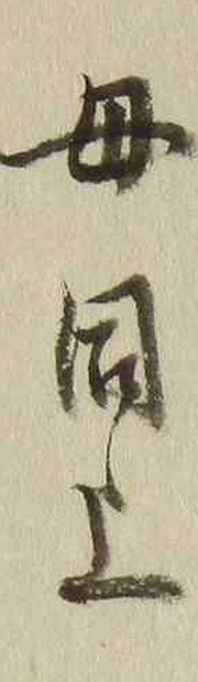母同上

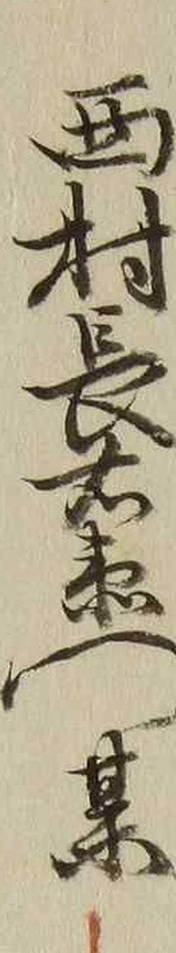西村長右衛門某
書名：諸士系譜　巻之53　に之部4
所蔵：会津若松市立会津図書館
